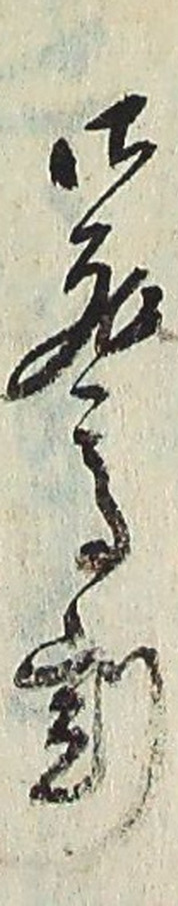御蔵高割

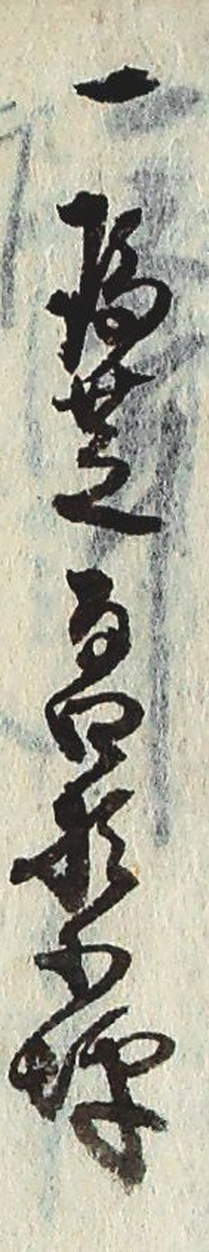一野芝百四拾五坪
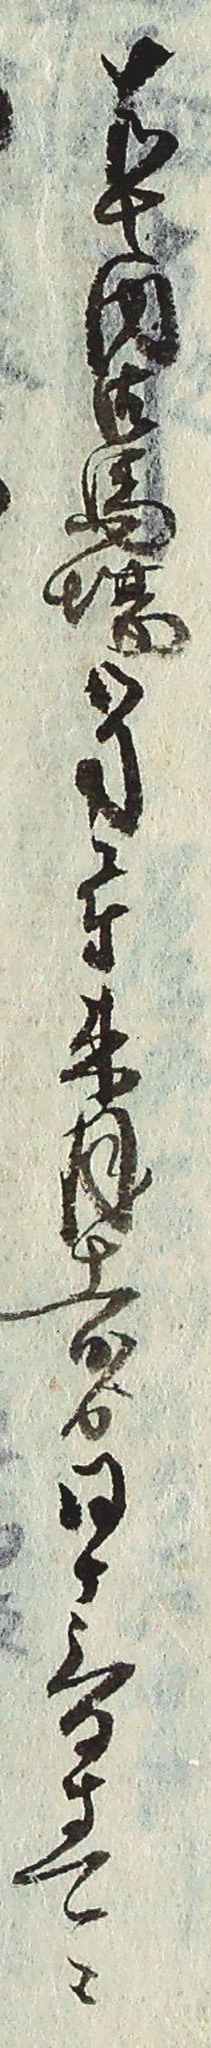右は内御馬場御用に付来月十一日ゟ同十三日まてに
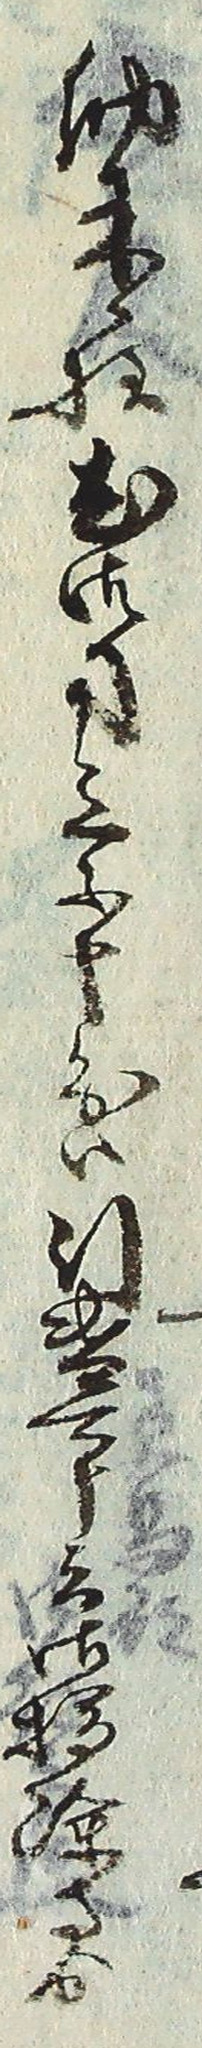納来候様尤御用立不申分は引替可申旨御掃除方ゟ
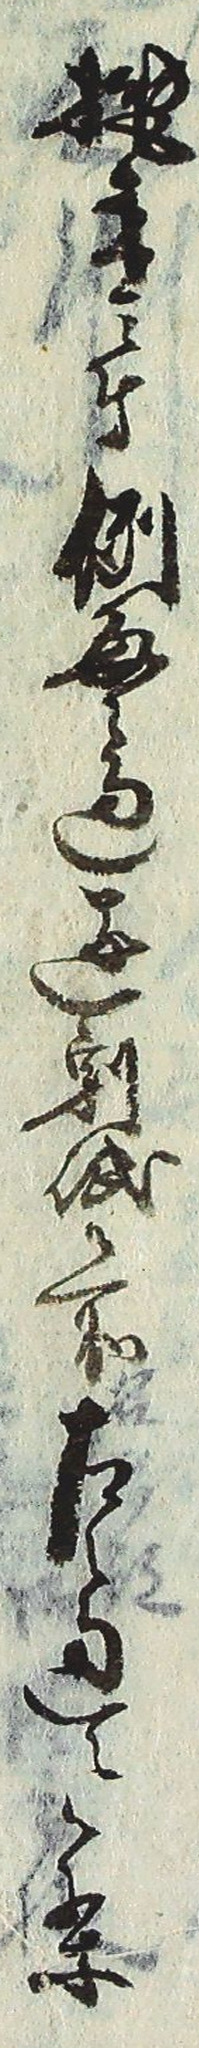誂来候に付例毎之通遂割賦候所右之通に候条
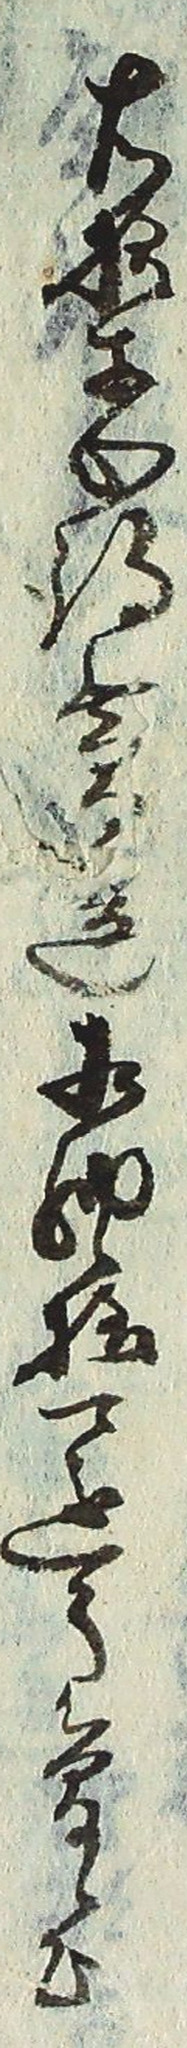右様相心得無間違相納候様遂了簡候以上
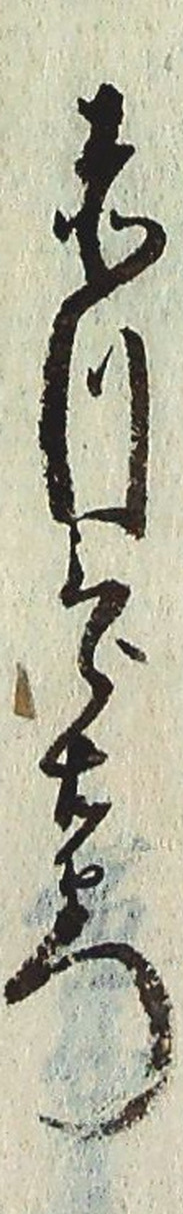赤川三郎右衛門
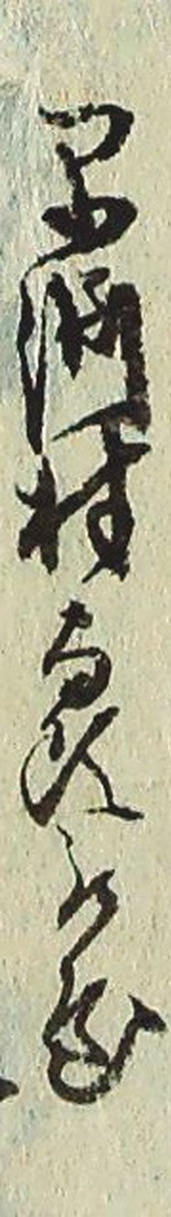早淵村組頭庄屋
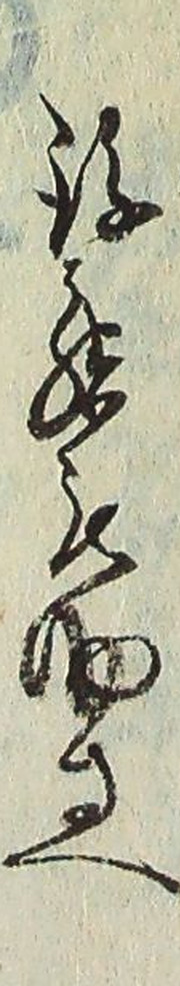後藤庄助方へ
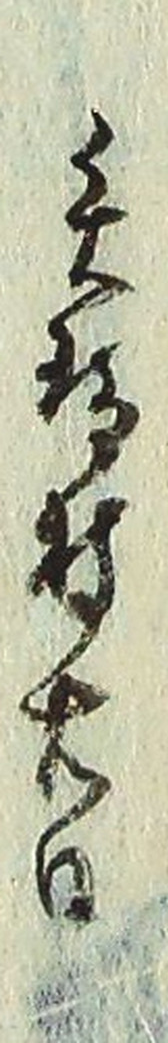矢野村右同
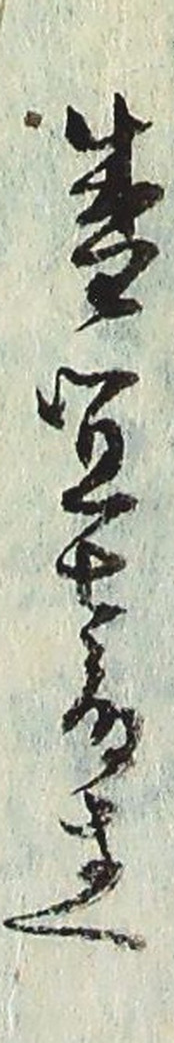盛宣七郎方へ
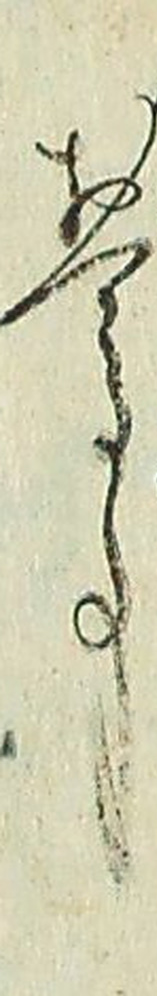惣高事
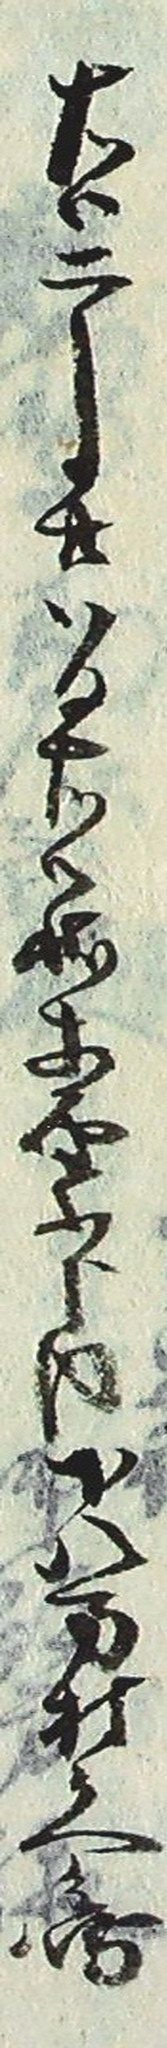右は二月廿八日右御状相届不申内下八万村久兵衛
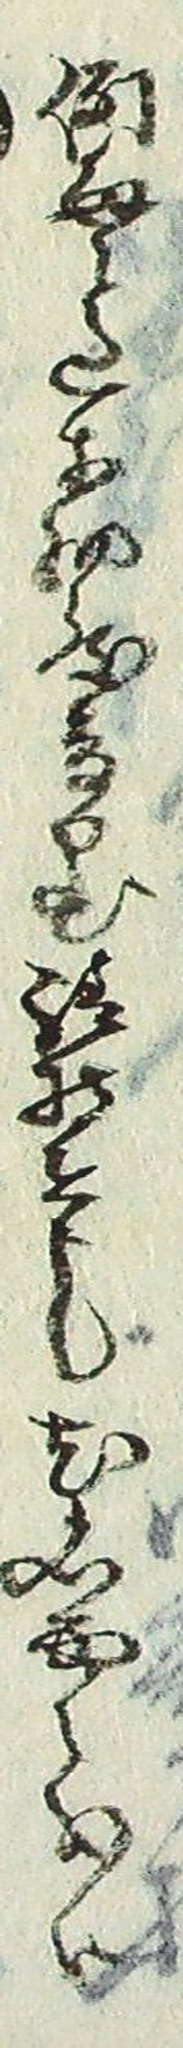例毎之通相納度旨申出請罷在申候尤名西之義は
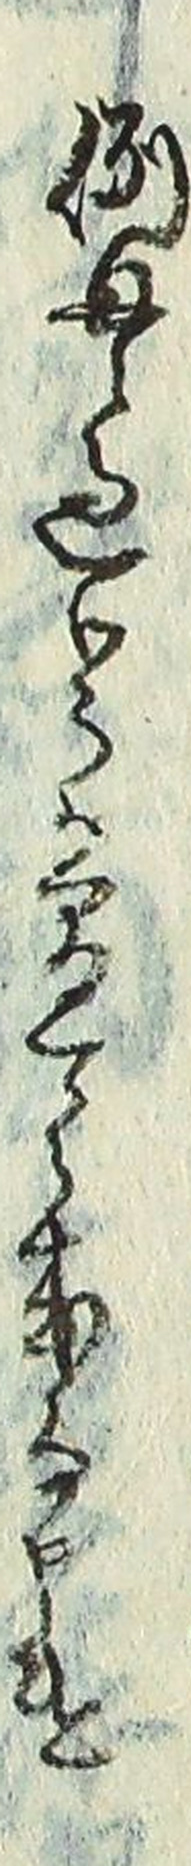例毎之通御了簡可被成と申遣
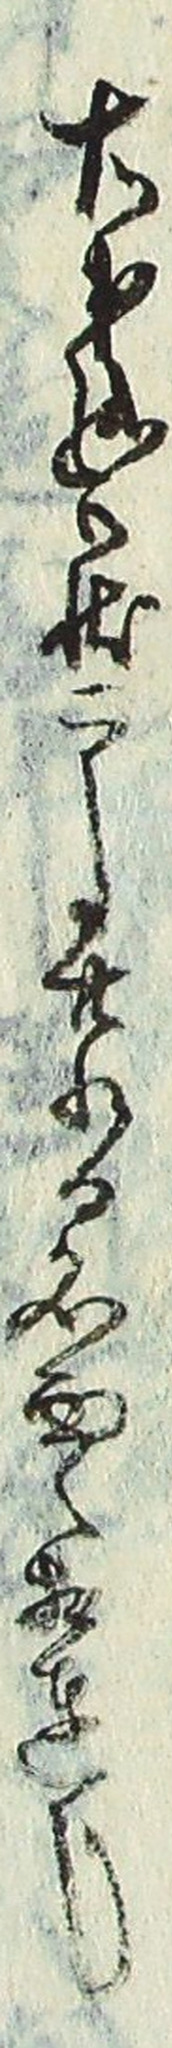右本紙御状二月廿九日名西へ相達申候
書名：名東郡中諸割賦元帳
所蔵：鳴門教育大学 Naruto University of Education
